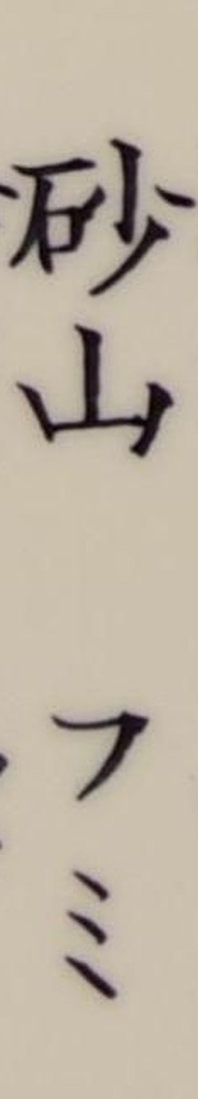砂山フミ
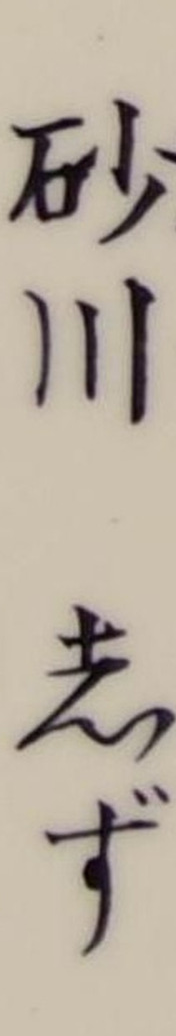砂川しず
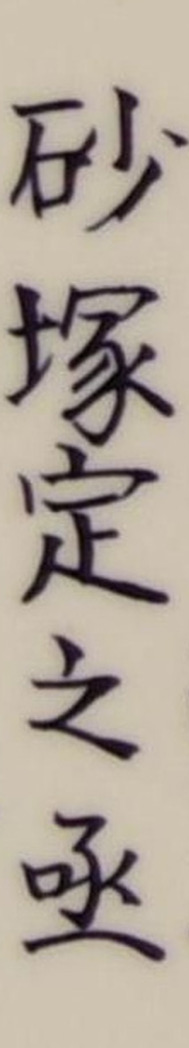砂塚定之丞
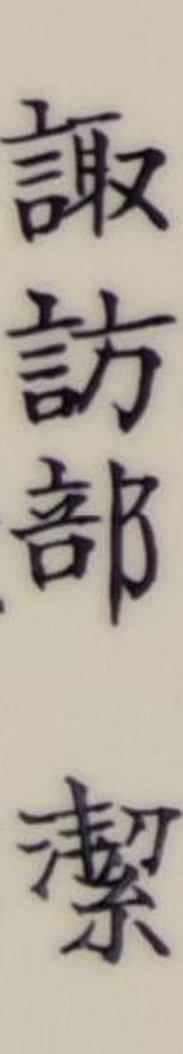諏訪部潔

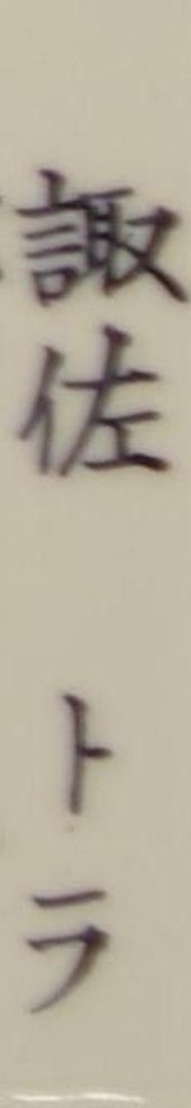諏佐トラ
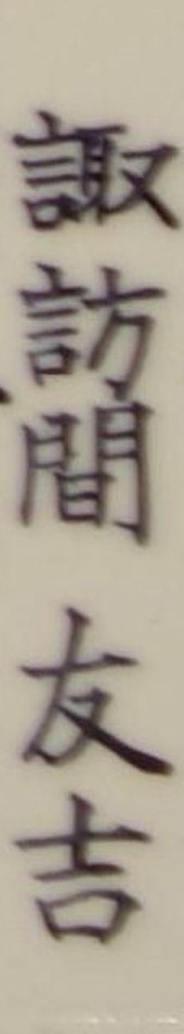諏訪間友吉
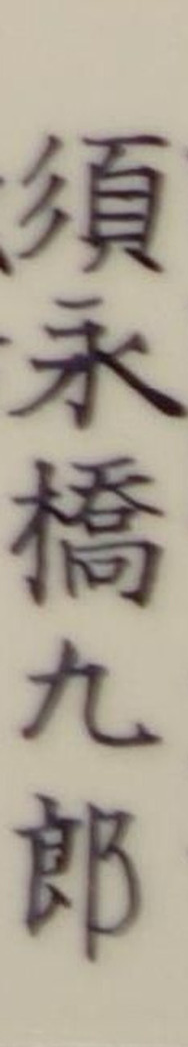須永橋九郎
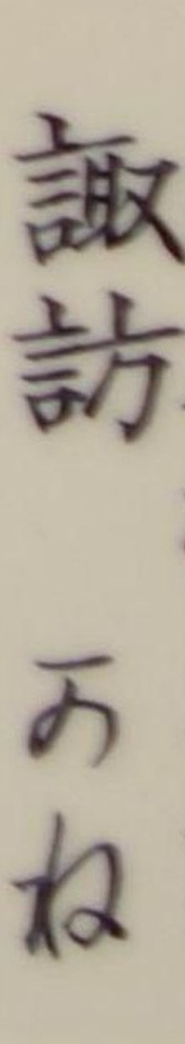諏訪かね
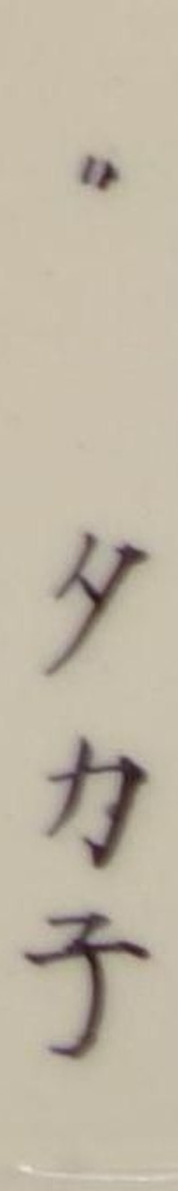タカ子
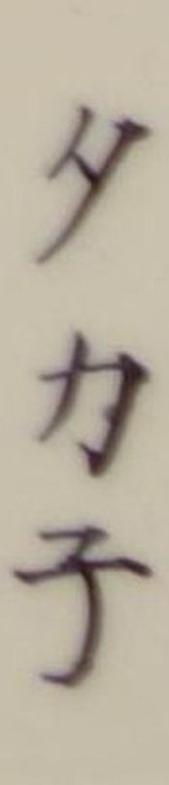タカ子
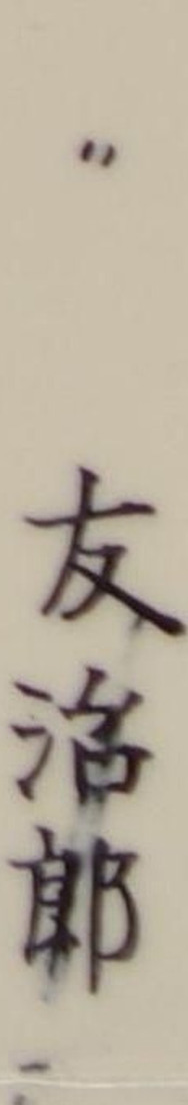友治郎
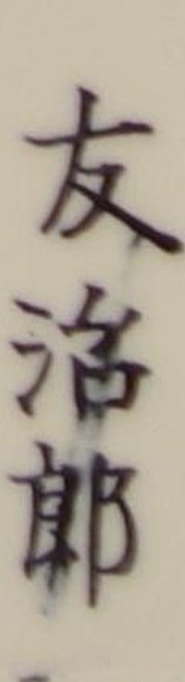友治郎
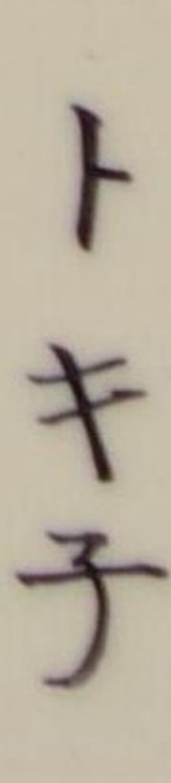トキ子
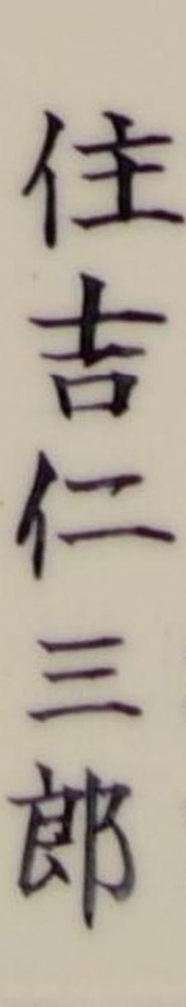住吉仁三郎
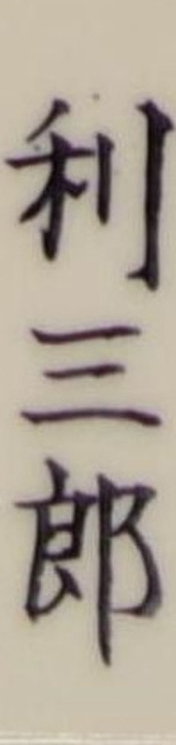利三郎
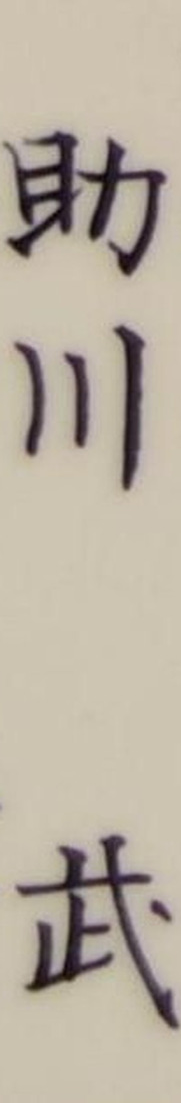助川武
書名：M~S
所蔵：高野山金剛峯寺
